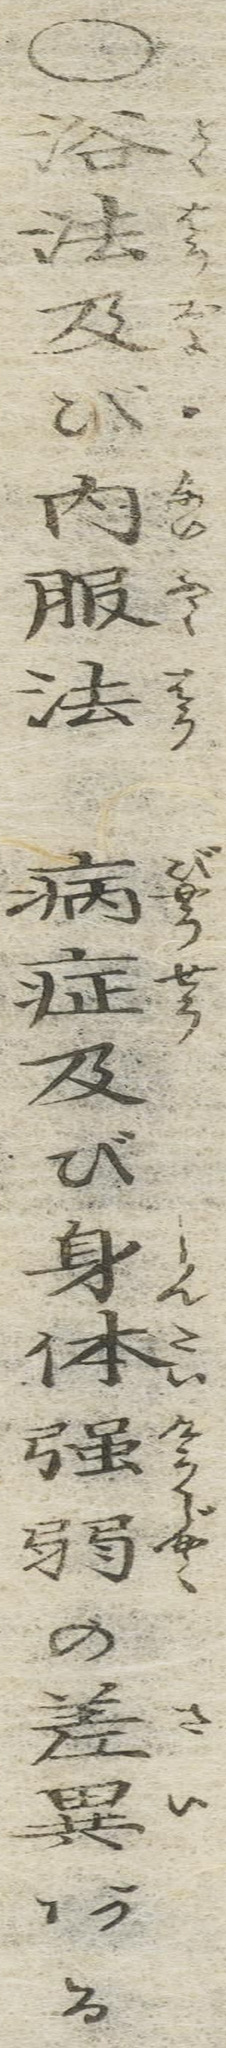○浴法及び内服法病症及び身体強弱の差異ある
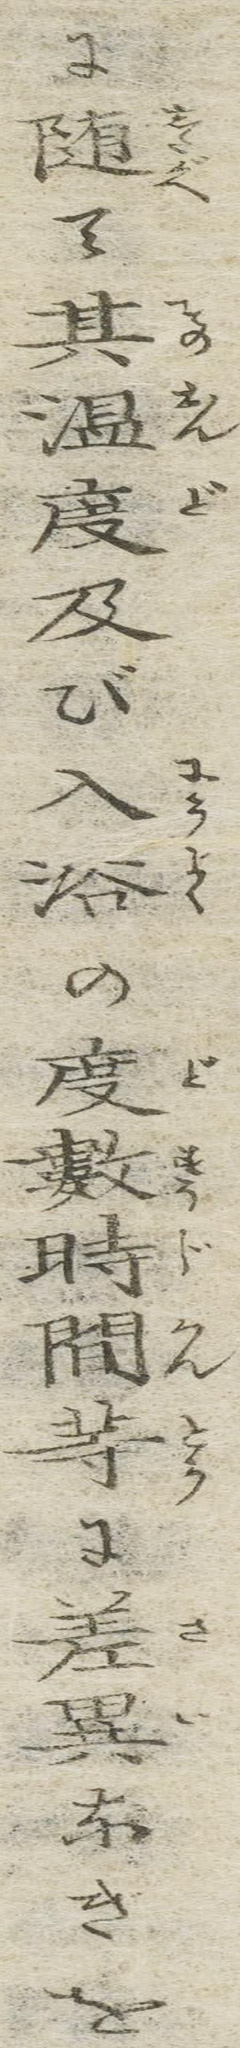に随て其温度及び入浴の度数時間等に差異なきを
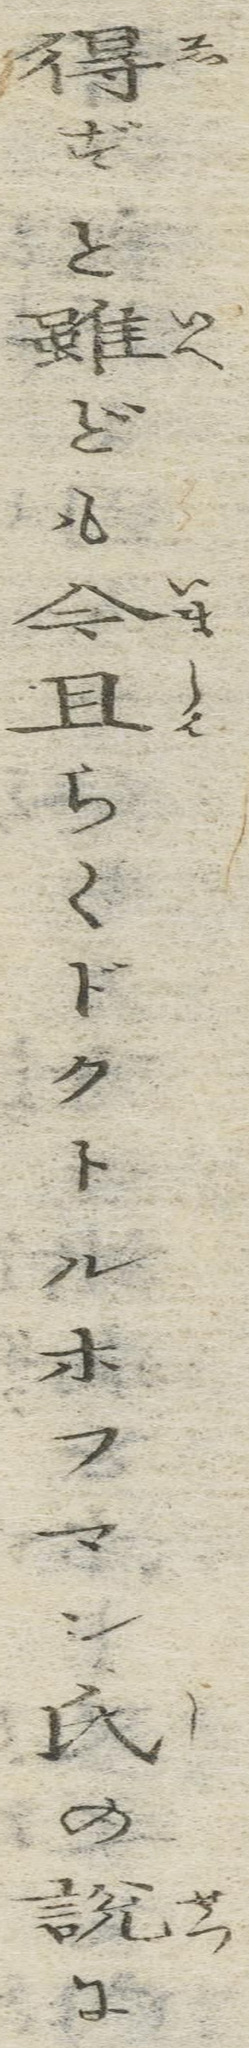得ずと雖ども今且らくドクトルホフマン氏の説に
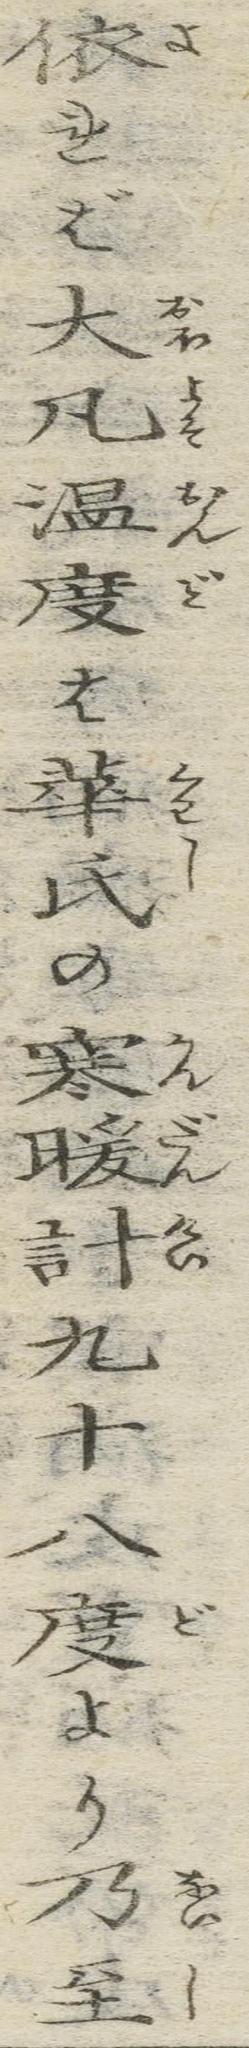依れば大凡温度は華氏の寒暖計九十八度より乃至
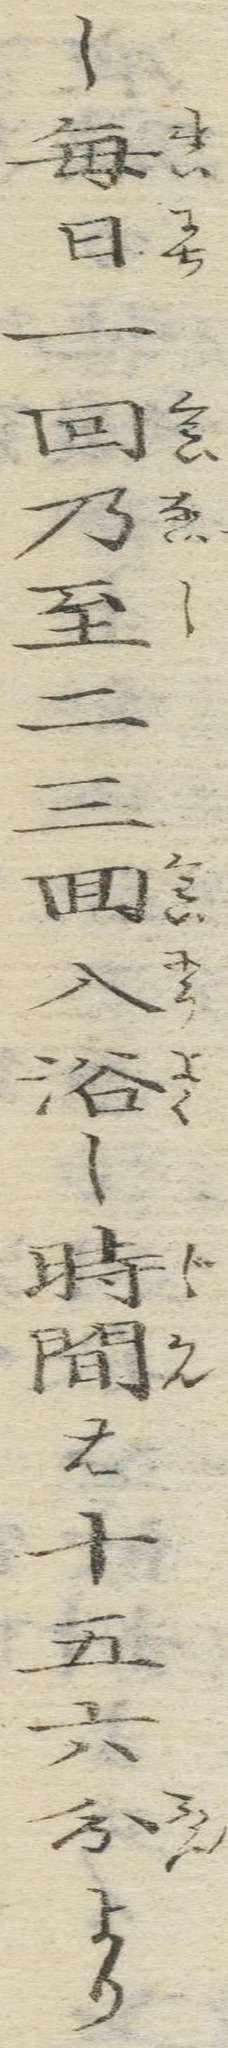し毎日一回乃至二三回入浴し時間は十五六分より
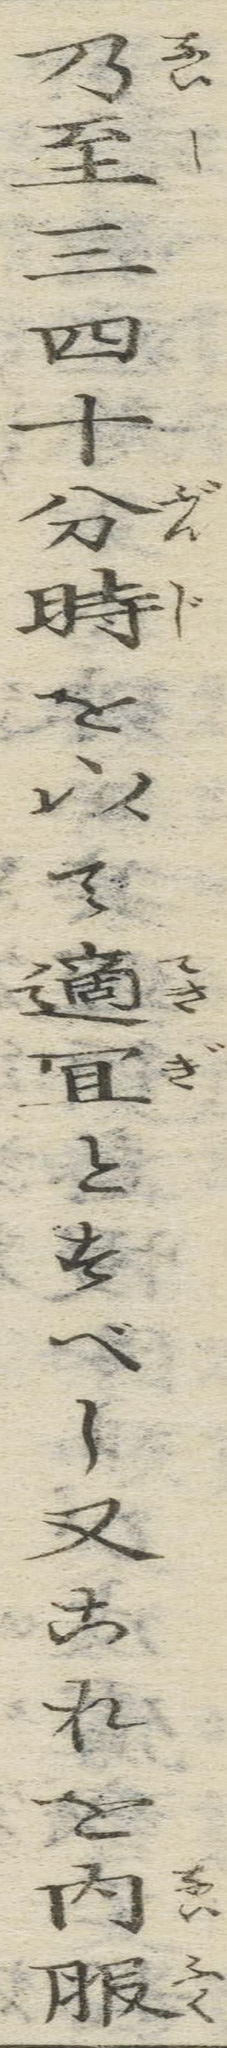乃至三四十分時を以て適宜とすべし又これを内服
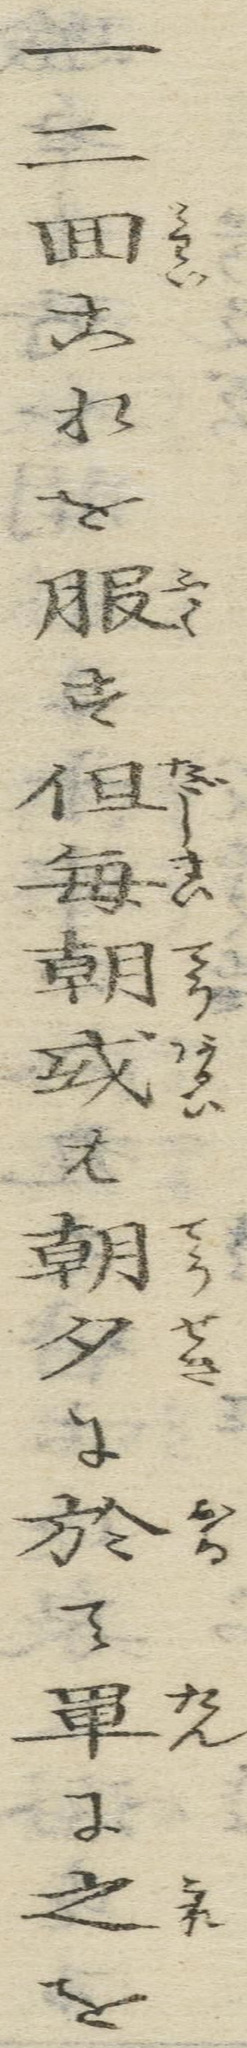一二回これを服す但毎朝或は朝夕に於て単に之を
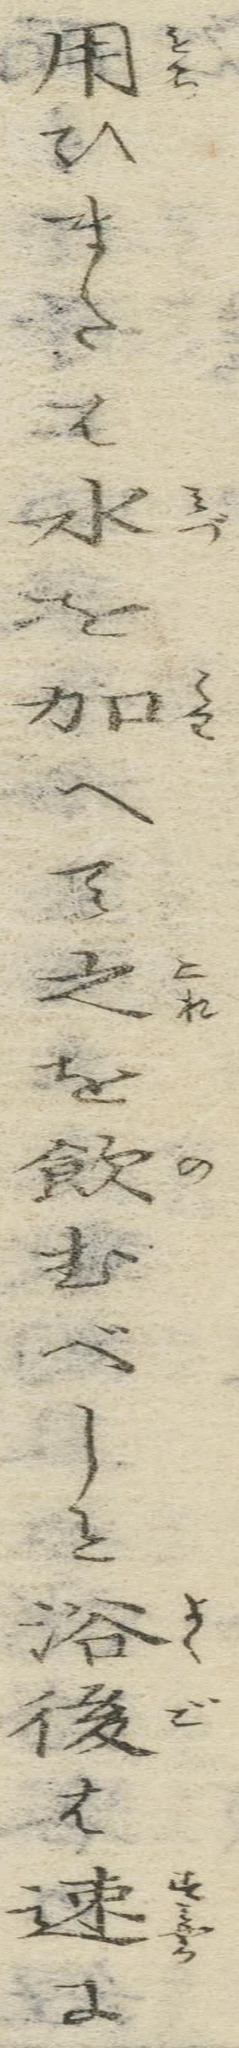用ひまたは水を加へて之を飲むべしと浴後は速に
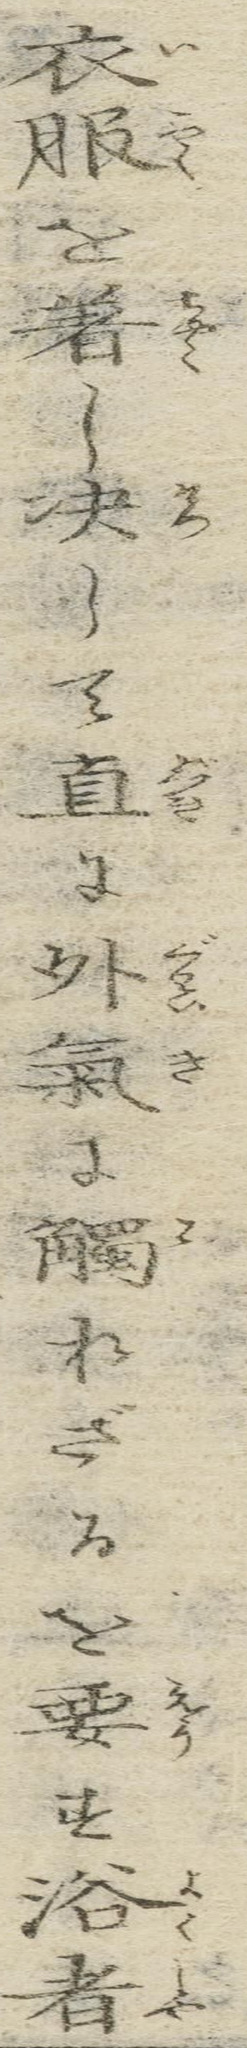衣服を着し決して直に外気に触れざるを要す浴者
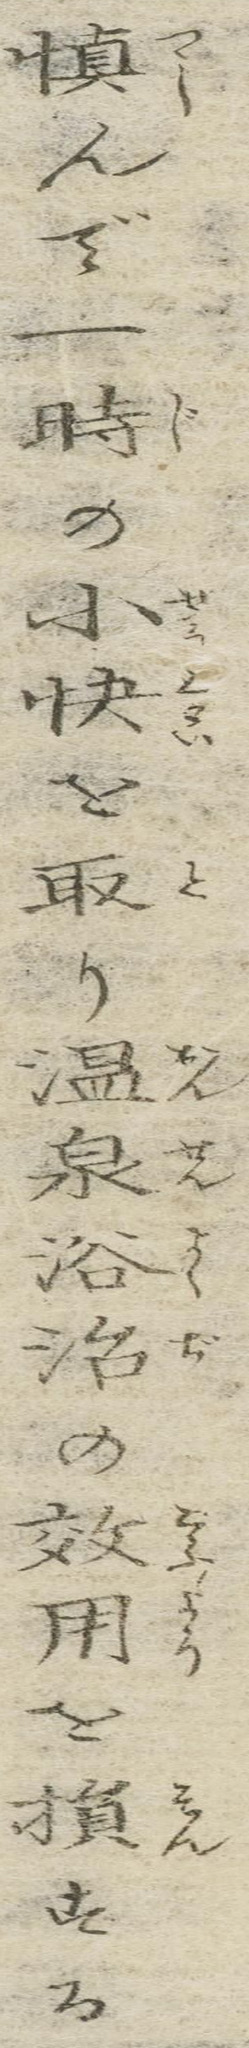慎んで一時の小快を取り温泉浴治の効用を損する
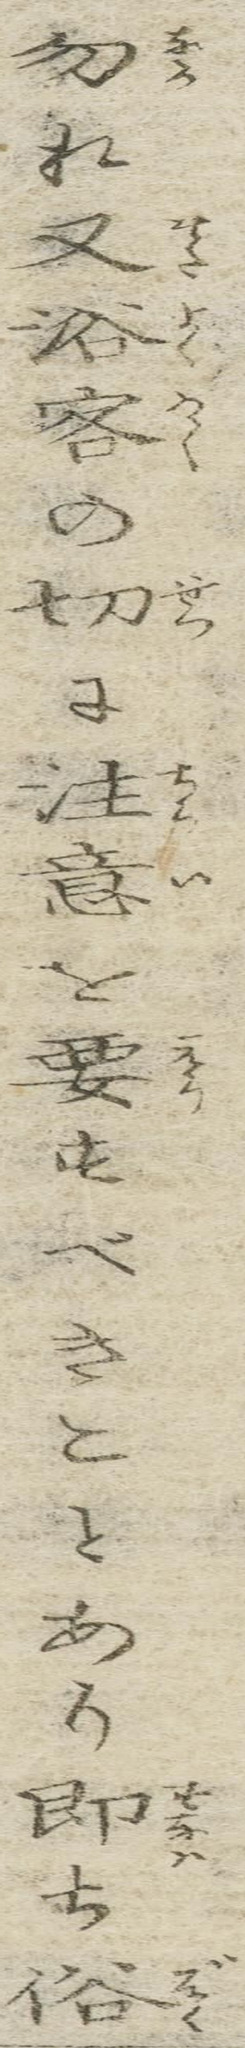勿れ又浴客の切に注意を要すべきことあり即ち俗
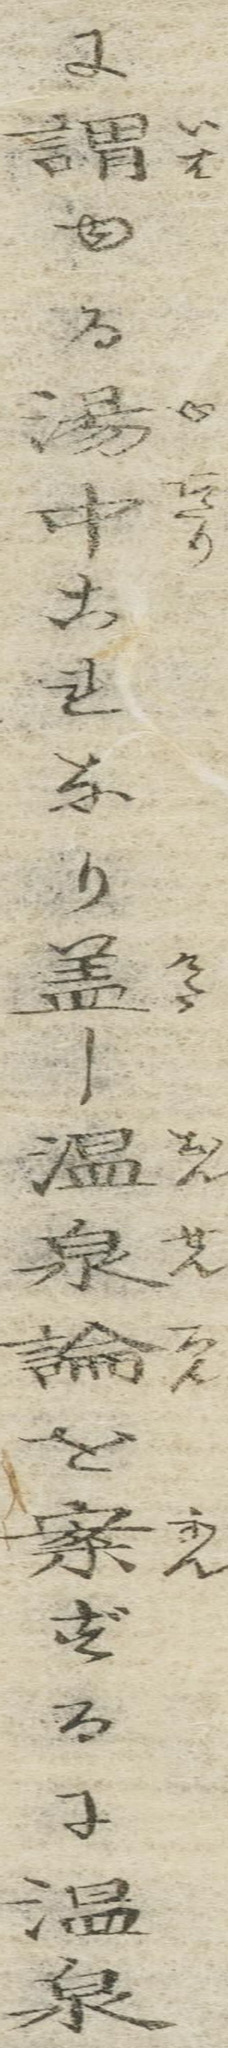に謂ゆる湯中これなり蓋し温泉論を案ずるに温泉
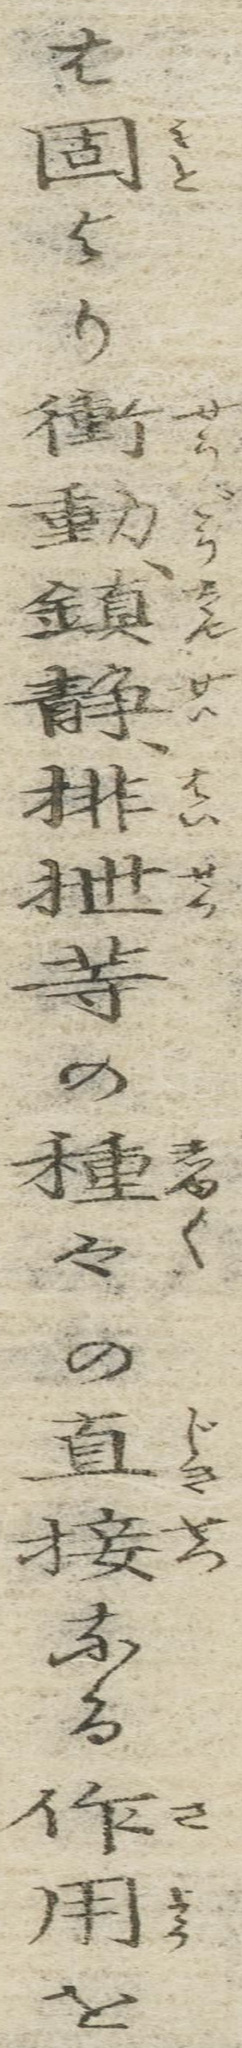は固より衝動、鎮静、排泄等の種々の直接なる作用を
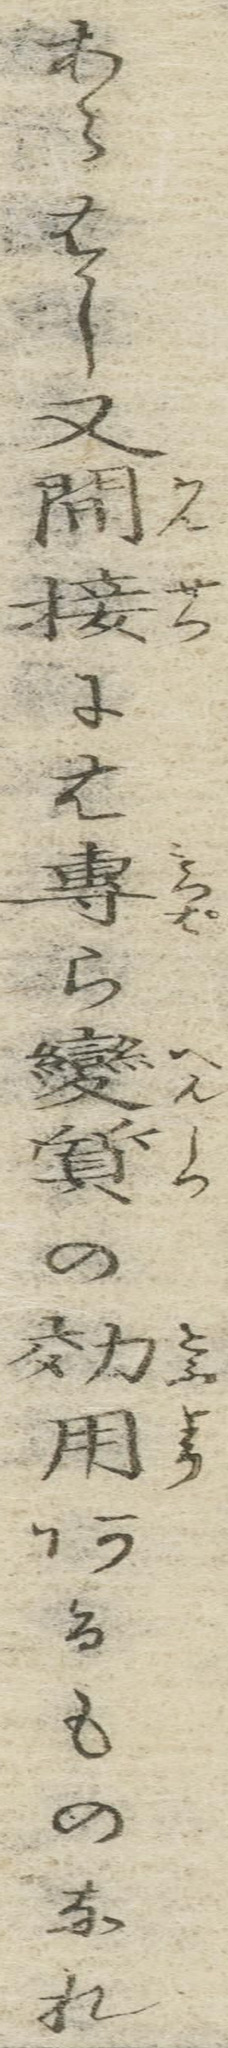あらはし又間接には専ら変質の効用あるものなれ
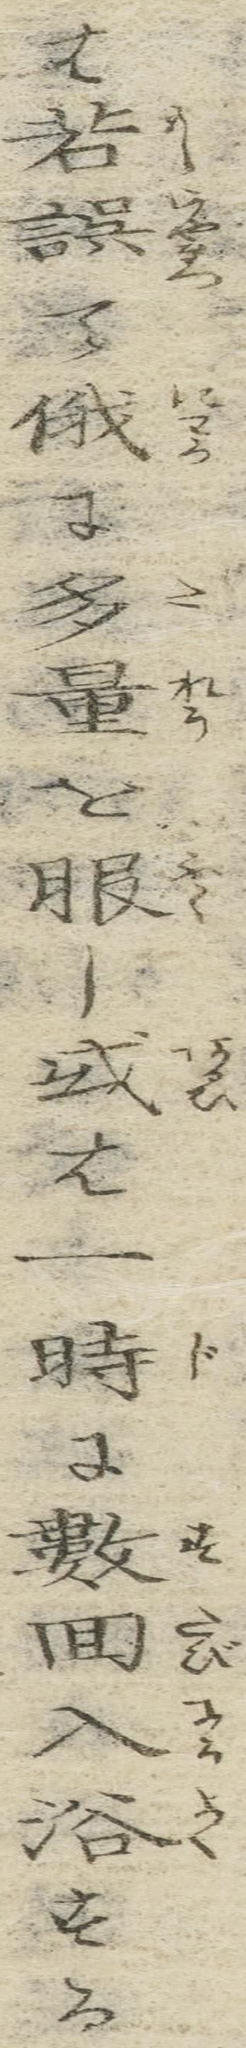は若誤て俄に多量を服し或は一時に数回入浴する

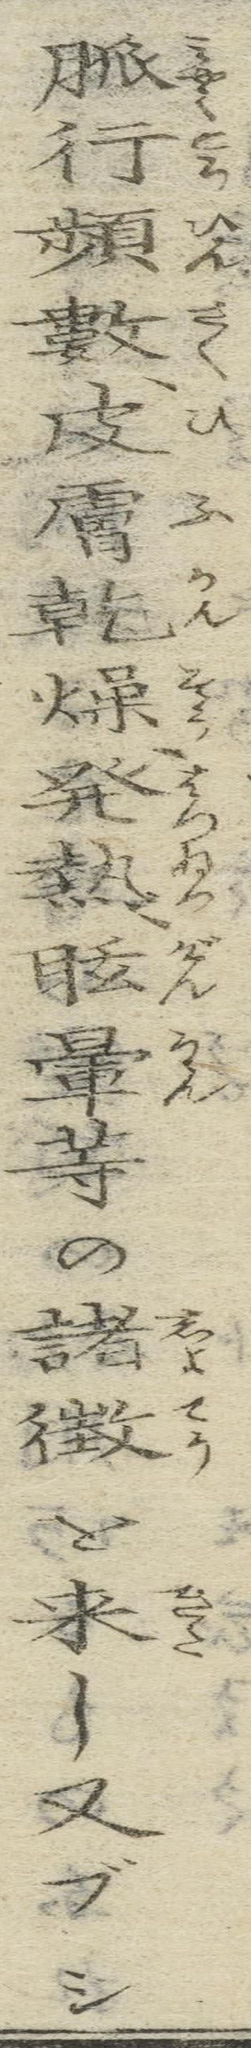脈行頻数、皮膚乾燥、発熱、眩暈等の諸徴を来し又ブシ
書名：豆州熱海誌　完
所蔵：東京大学地震研究所図書室 Earthquake Research Institute Library, The University of Tokyo, JAPAN
